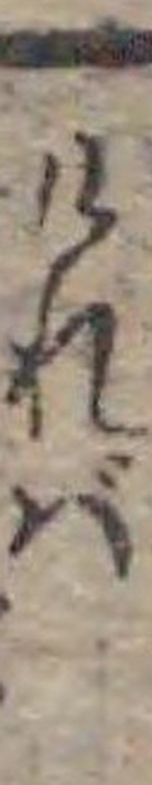ければ
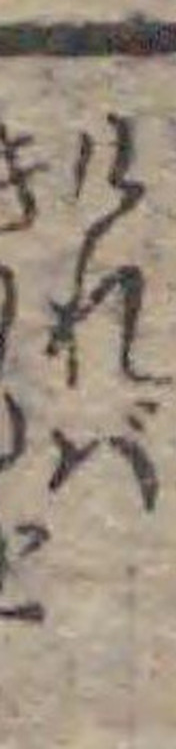ければ
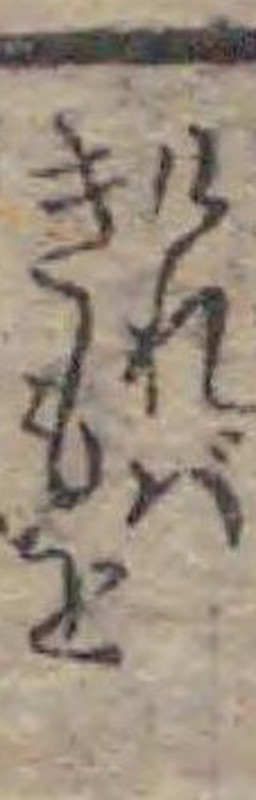きもを
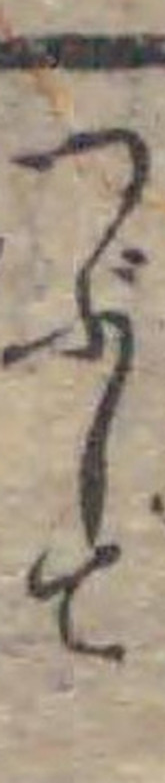つぶして
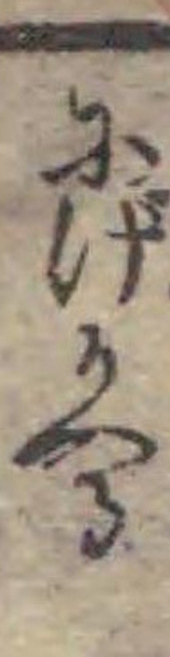にげかへる

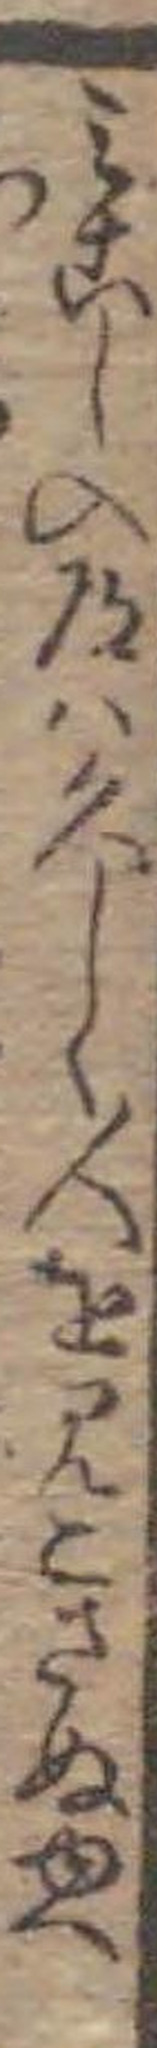みこし入道は久しく人を見こさぬゆへ
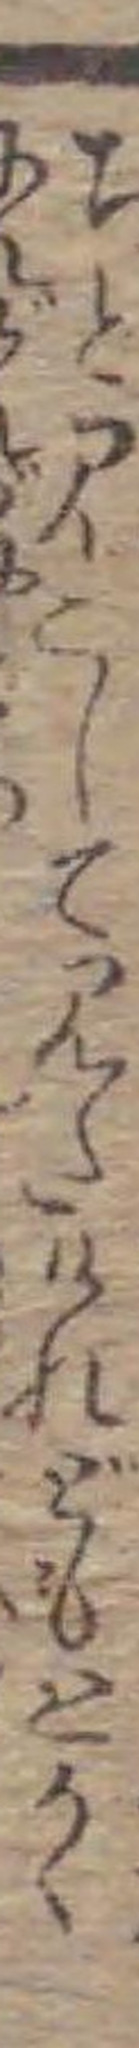ちと見こしてみたけれどもとかく
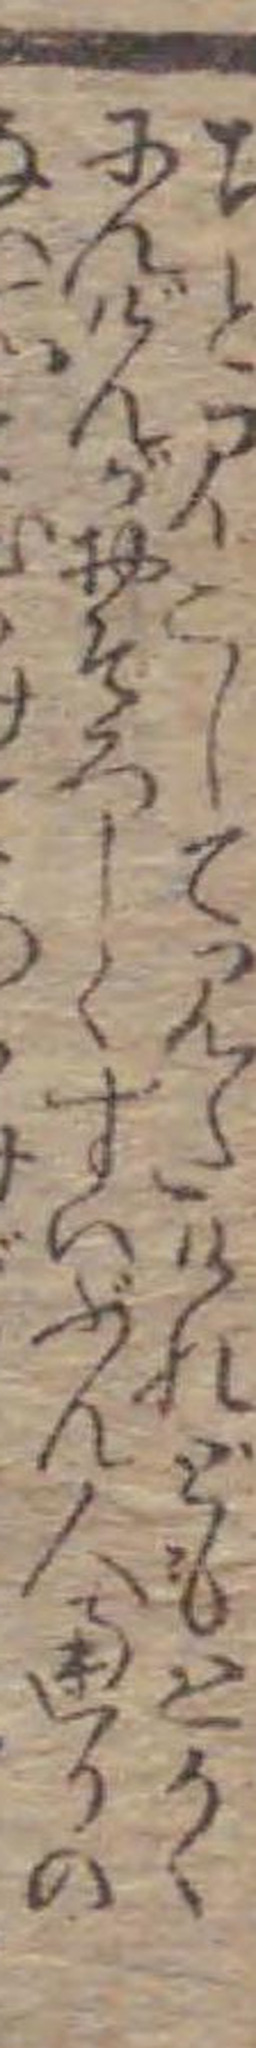にんげんがおそろしくずいぶん人通りの
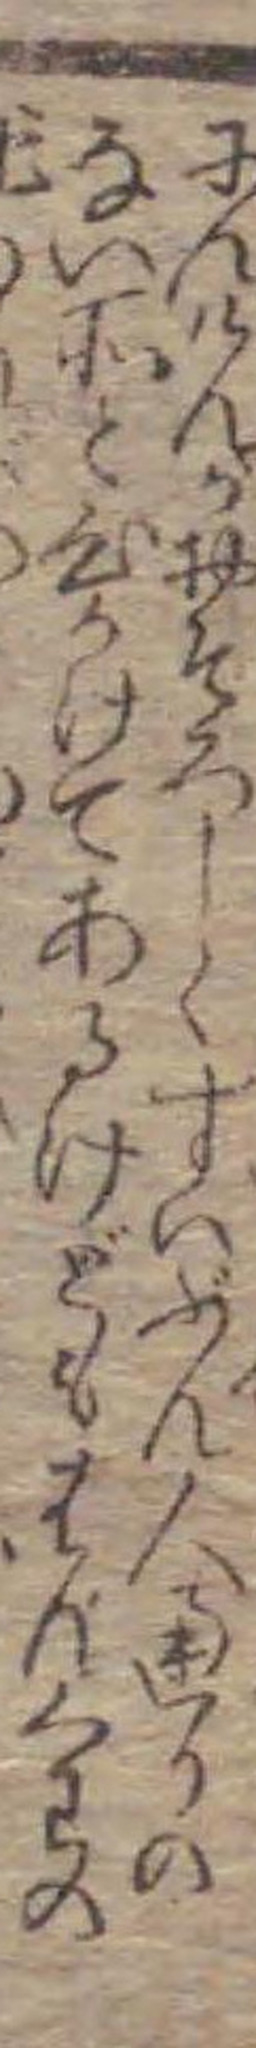ない所と出かけてあるけどもはんくわの
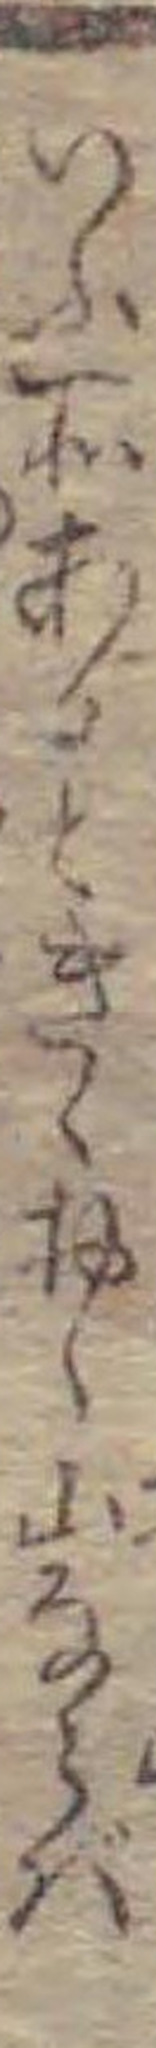いふ所あるときゝおく山ならば
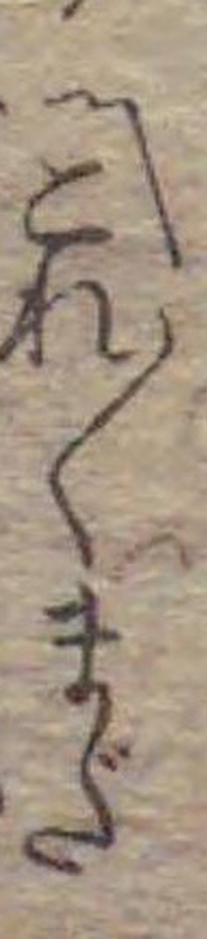〽これ〳〵まだ
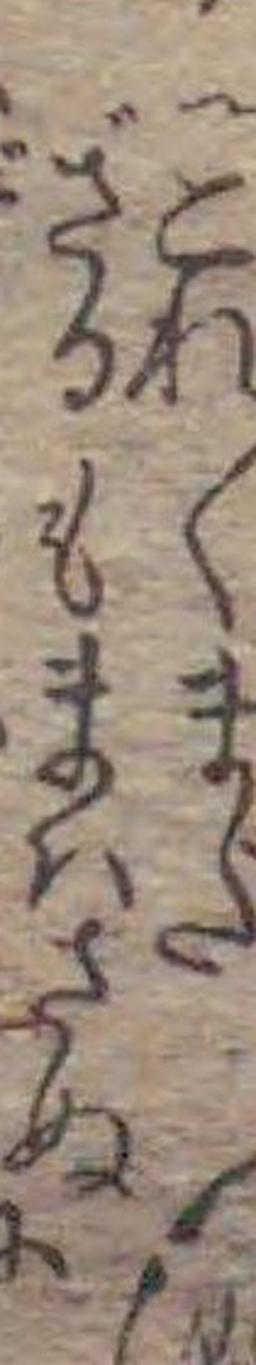ざるもまはさぬに
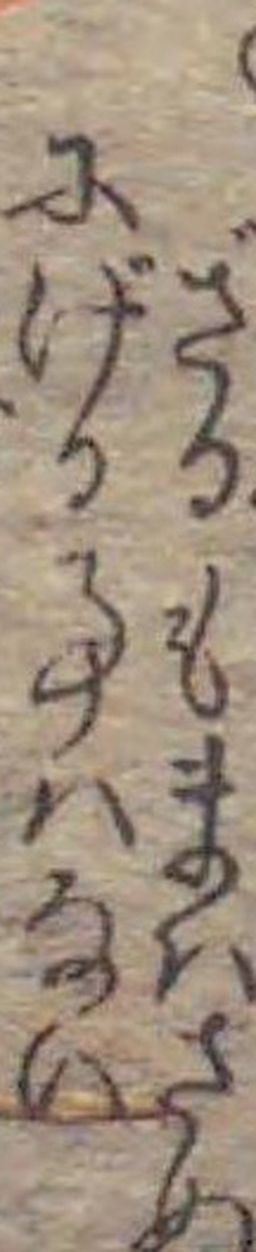にげる事はない
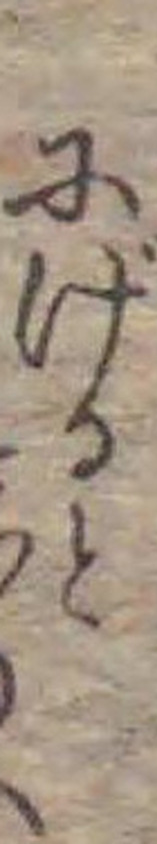にげると
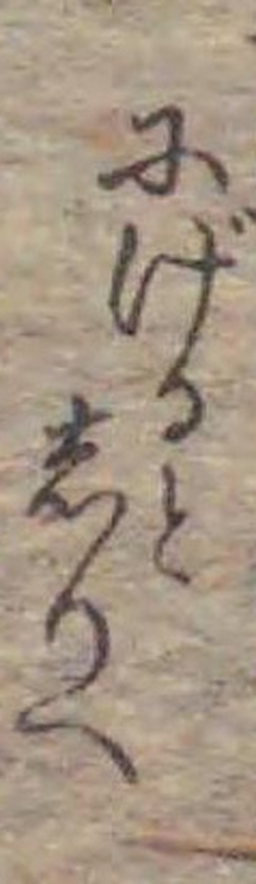しりへ
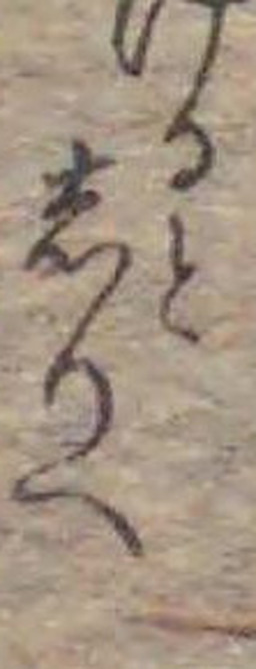しりへ
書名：怪物つれつれ草 : 2巻
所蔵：国立国会図書館 National Diet Library, JAPAN
